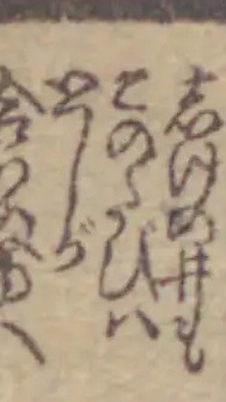このたびは
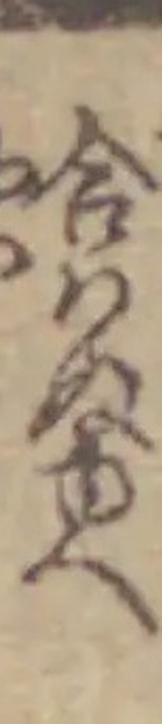合はぬゆへ
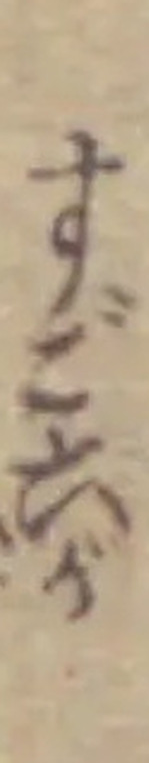すご六が
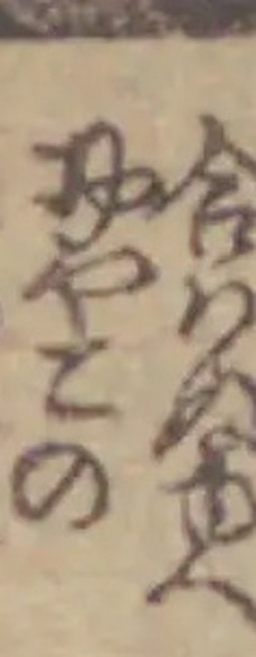おやこの
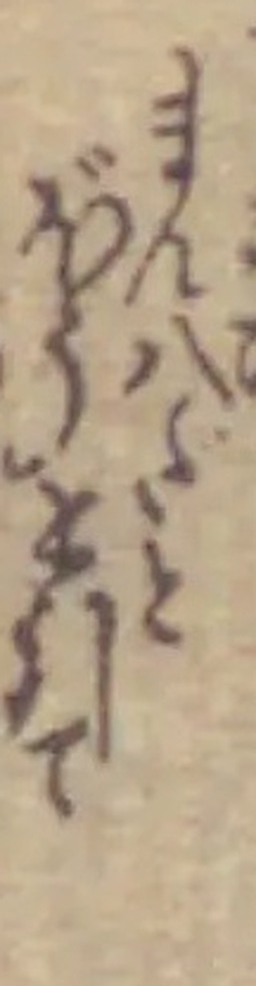ぼうを引て
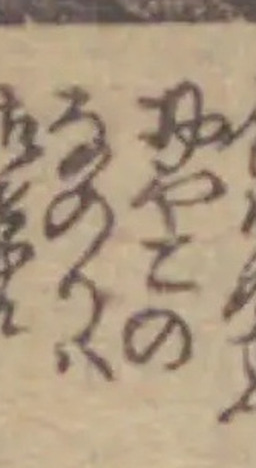なのりは
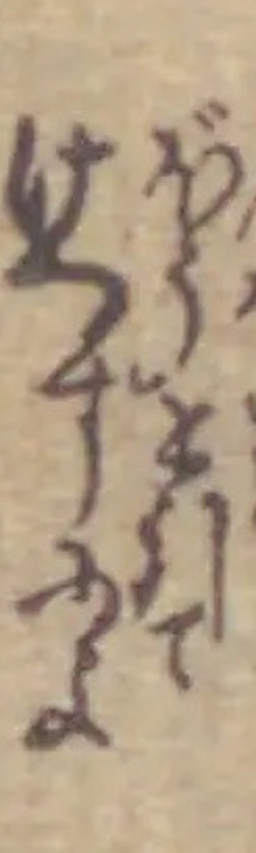けつすによ
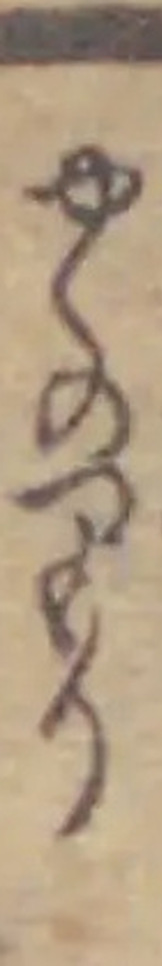やくのつもり
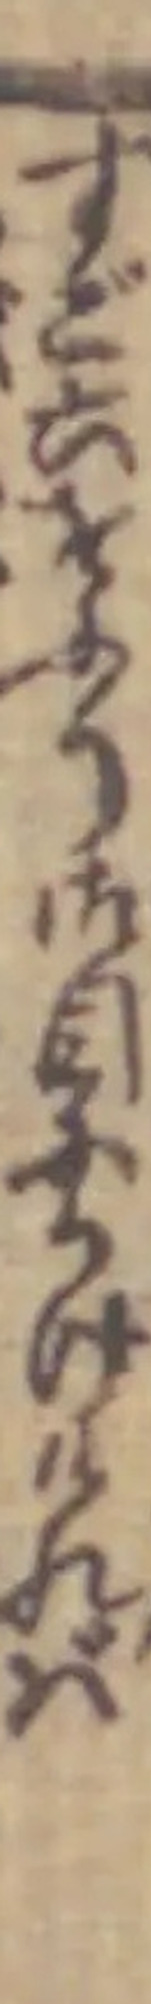すご六をふり御目にかけければ
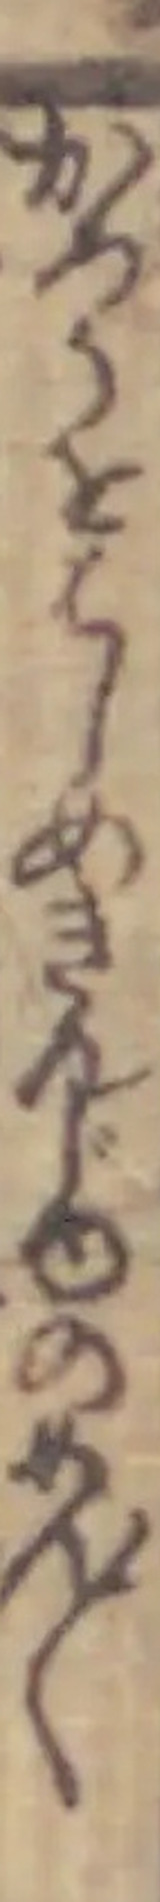かろうをはしめきんじゆのめん〳〵
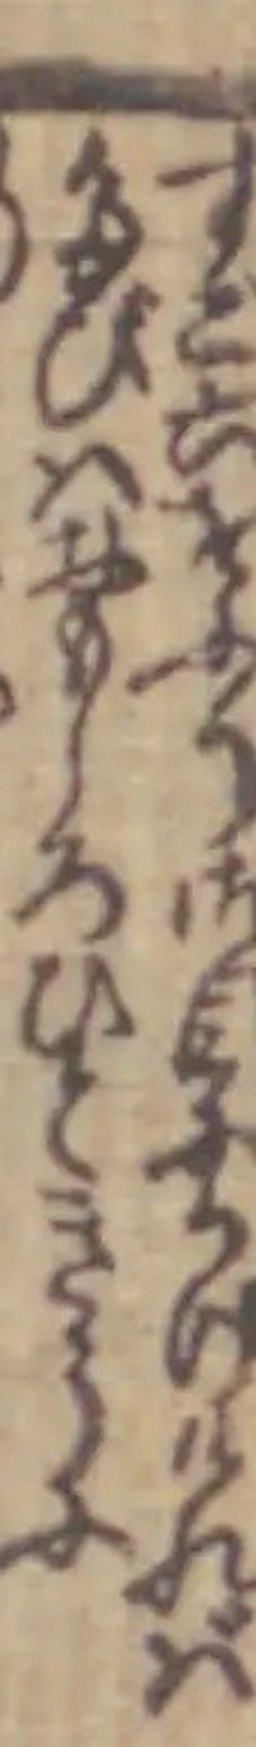たびはおもしろひときうに
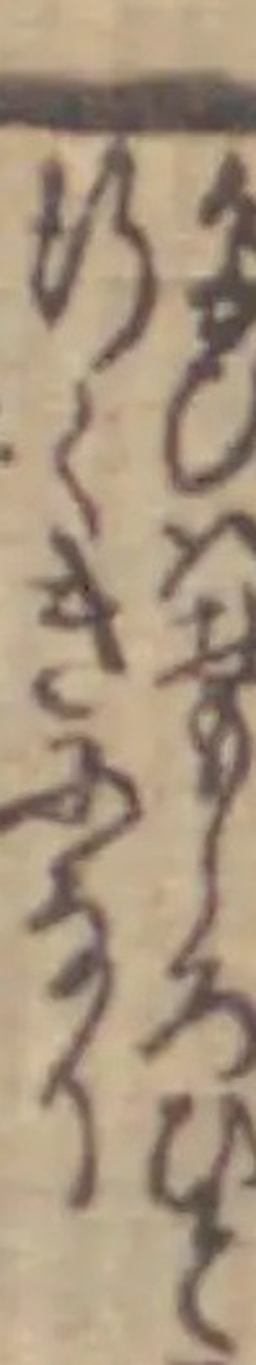行くきになり
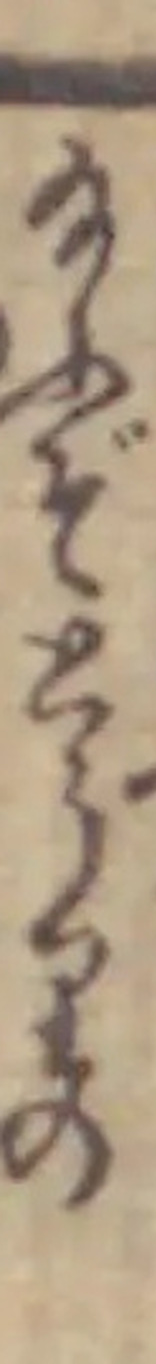給ふぞとうりの
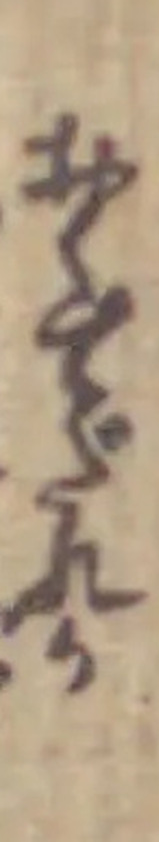おくてだれか
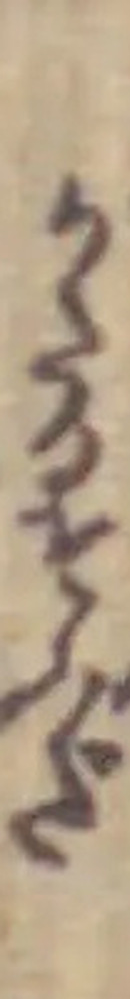かたるそふだ
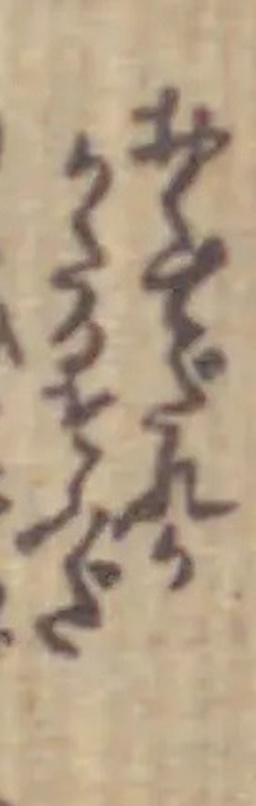かたるそふだ
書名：道笑双六
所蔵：国立国会図書館 National Diet Library, JAPAN
